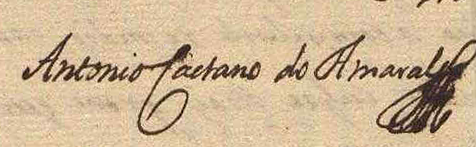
Antonio Caetano do Amaral
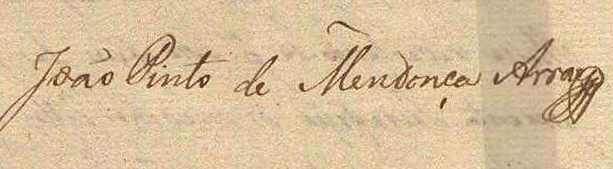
João Pinto de Mendonça Arraes
